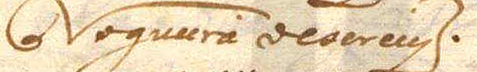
Nogueira o escreuj.
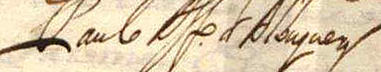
Paulo Aff.o d'Albuquerq̄
